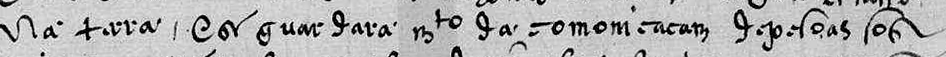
na terra, e se guardara mto da comonicaçam de pesoas sos
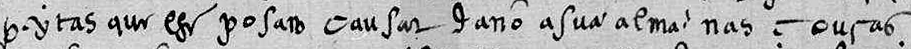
peytas que lhe posam causar dano a sua alma nas cousas
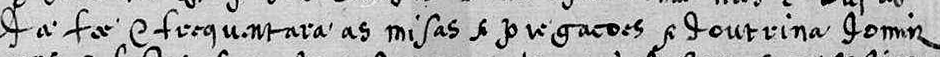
da fee e frequentara as misas e pregaçoes e doutrina domin
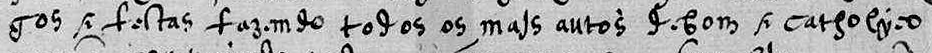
gos e festas fazemdo todos os majs autos de bom e catholyco
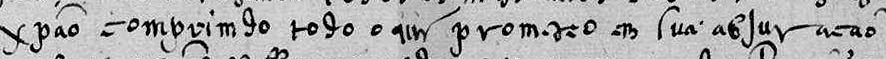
xpão comprimdo todo o que prometeo em sua abjuraçaõ
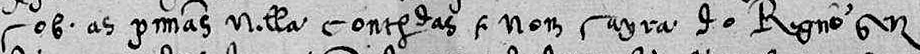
sob as pnnās nella conthdas e nom sayra do Regno sem
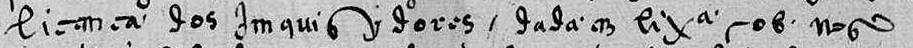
licemça dos Jmquisydores / dada em lixa sob noso
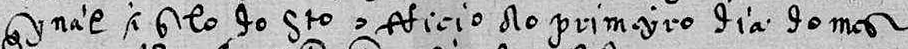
synal e selo do Sto officio Ao primeyro dia do mes
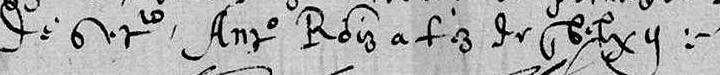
de setro Anto Roīz a fez de j̄ bclxij
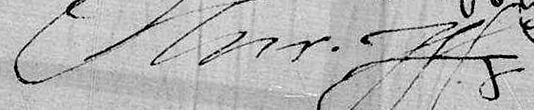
O Car. Jffꝭ
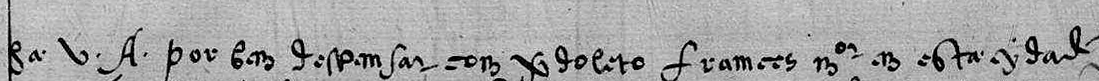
ha v. A. por bem despemsar com ꝟdoleto framces mor em esta cydade
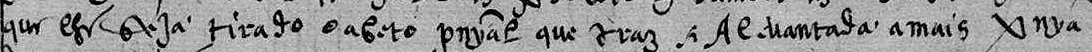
que lhe seJa tirado o abeto pnyāl que traz e Aleuantada a mais pnyā
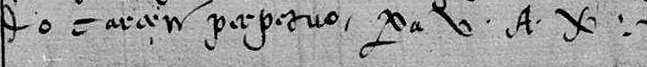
do carcere perpetuo, ꝑa v. A. ꝟ.
